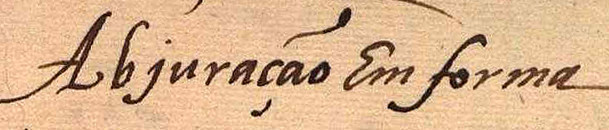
Abjuraçaõ Em forma
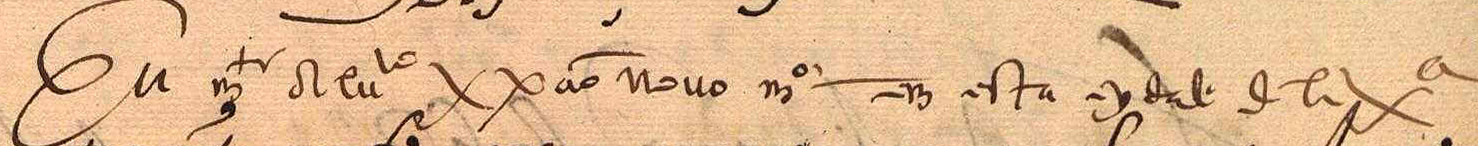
Eu mte Aluro Xpaõ nouo mor em esta cydade de lixa
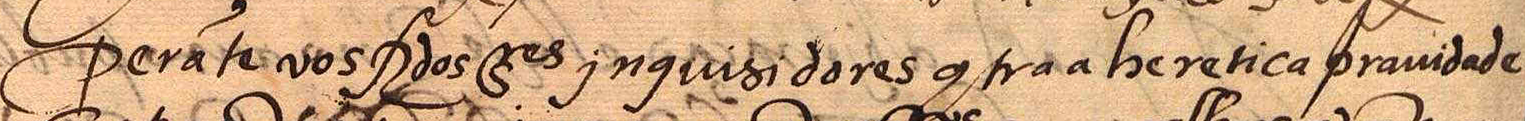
Perāte vos Rdos sres jnquisidores ꝯtra a heretica prauidade
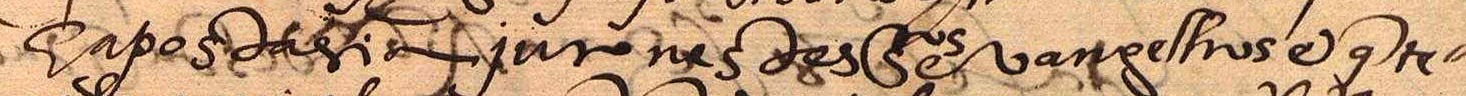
E apostasia juro nestes stos evangelhos ē q̄ te
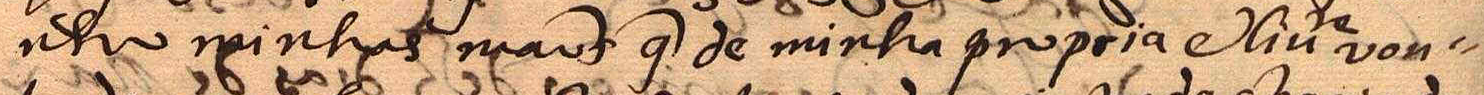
nho minhas maõs q̄ de minha propria e liure von
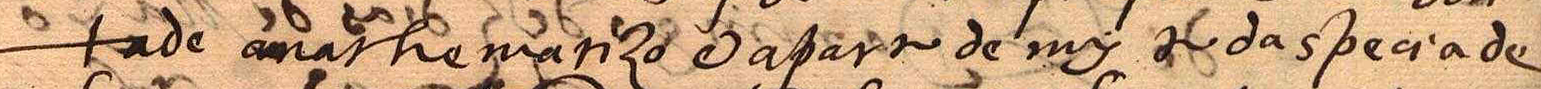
tade anathematizo e aparto de my toda specia de
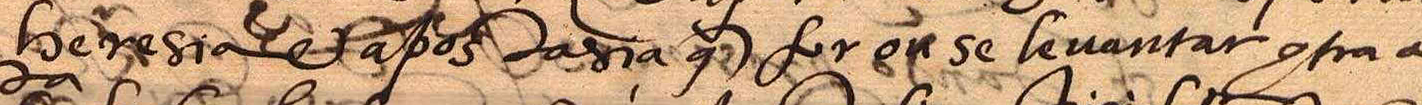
heresia e apostasia q̄ for ou se leuantar ꝯtra a
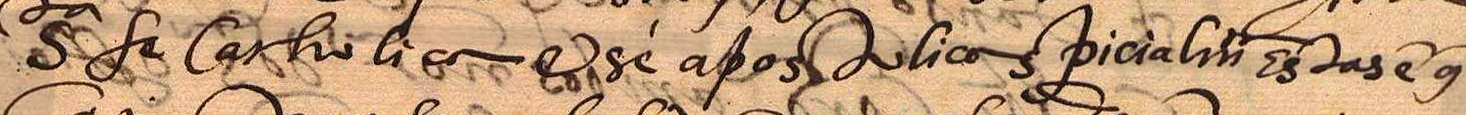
Sta fe Catholica e sé apostolica spicialmte Estas ē q̄
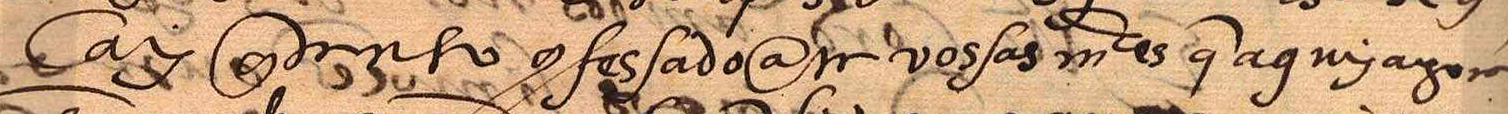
Cay q̄ tenho ꝯfessado ātre vossas m̄ces q̄ aquy agora
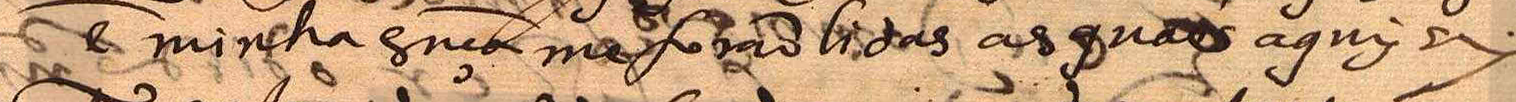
ē minha snçā me forão lidas as quaes aquy Ey
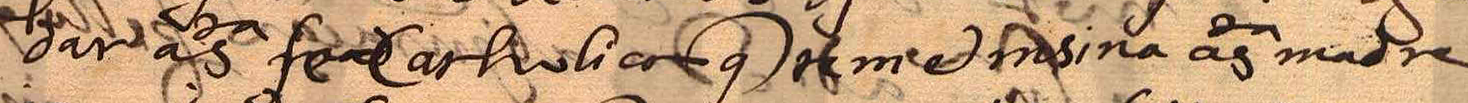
dar a sta fee Catholica q̄ tem emsina a sta madre
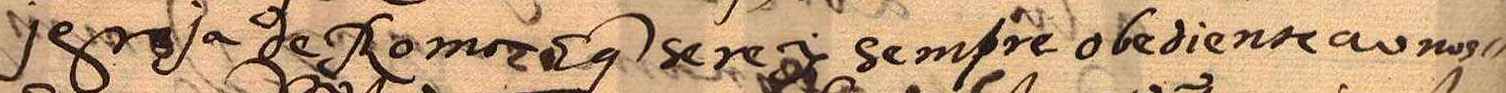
jgreja de Roma E q̄ serey sempre obediente ao nos
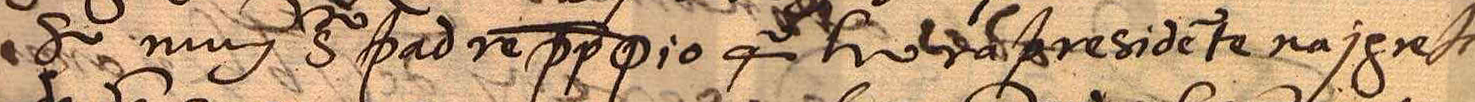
so muy sto padre p̄p̄ pio 4o hora presidēte na jgreja
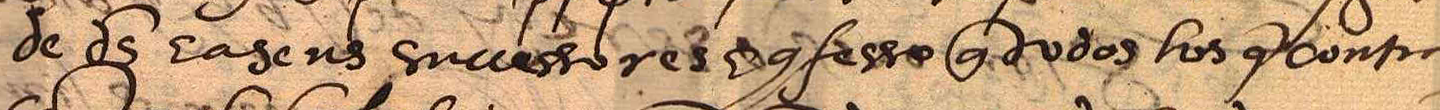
de ds̄ E a seus successores E ꝯfesso q̄ todos hos q̄ contra
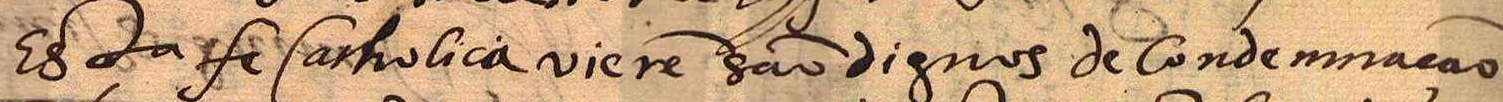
Esta fe Catholica vierē são dignos de condemnação
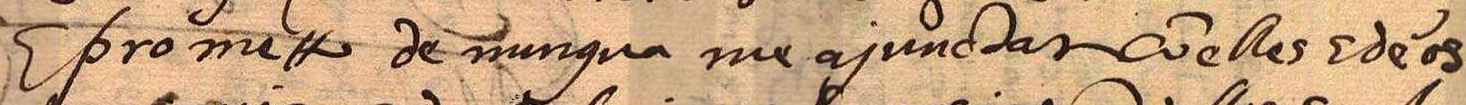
E prometto de nunqua me ajunctar cō elles E de os
